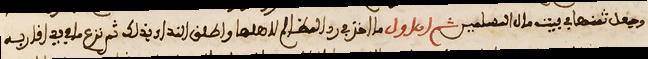وجعل ثمنها في بيت مال المسلمين ثم ان اول ما اخذ في رد المظالم لاهلها واطلق النداء بذلك ثم نزع ما في يد اقاربه
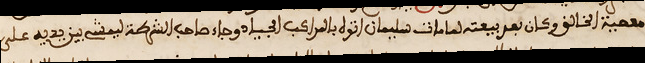معصية الخالق وكان بعد بيعته لما مات سليمان اتوه بالمراكب الجياد وجاء صاحب الشرطة ليمشى بين يديه على
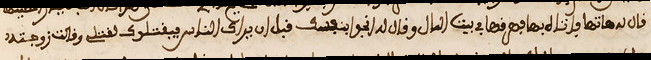قال له هاتها فاتاه بها فهرقها في بنت المال وقال له انجوا بنفسك فبل ان يراك الناس فيقتلوك لقتلى وقالت زوجته
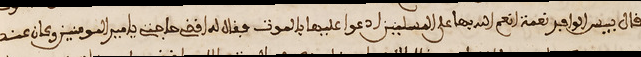قال بيس الوافد نعمة انعم الله بها على المسلمين ادعوا عليها بالموت فقال له اقضى حاجتى يامير المومنين وكان عند
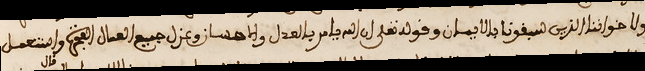ولا خواننا الذين سبقونا بالايمان وقوله تعلى ان الله يامر بالعدل والاحسان وعزل جميع العمال الفجرة واستعمل
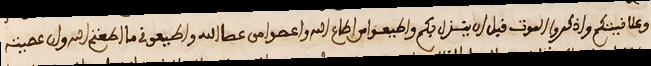وعلانيتكم واذكروا الموت قبل ان ينزل بكم واطيعوا من اطاع الله واعصوا من عصا الله واطيعونى ما اطعتم الله وان عصيته
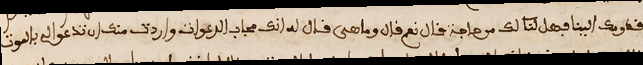قدومك الينا فهل لنا لك من حاجة قال نعم قال وماهى قال له انك مجاب الدعوات واردت منك ان تدعوا لى بالموت
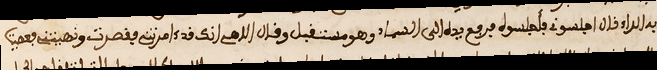به الداء قال اجلسونى فاجلسوه فرفع يده الى السماء وهو مستقبل وقال اللهى انك قد ءامرتنى فقصرت ونهيتنى فعصيب
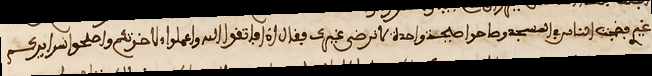غيرى فضجت الناس في المسجد وصاحوا صيحة واحدة لا نرضى غيرك فقال اذا فاتقوا الله واعملوا ءلاخرتكم اصلحوا سرايركم
